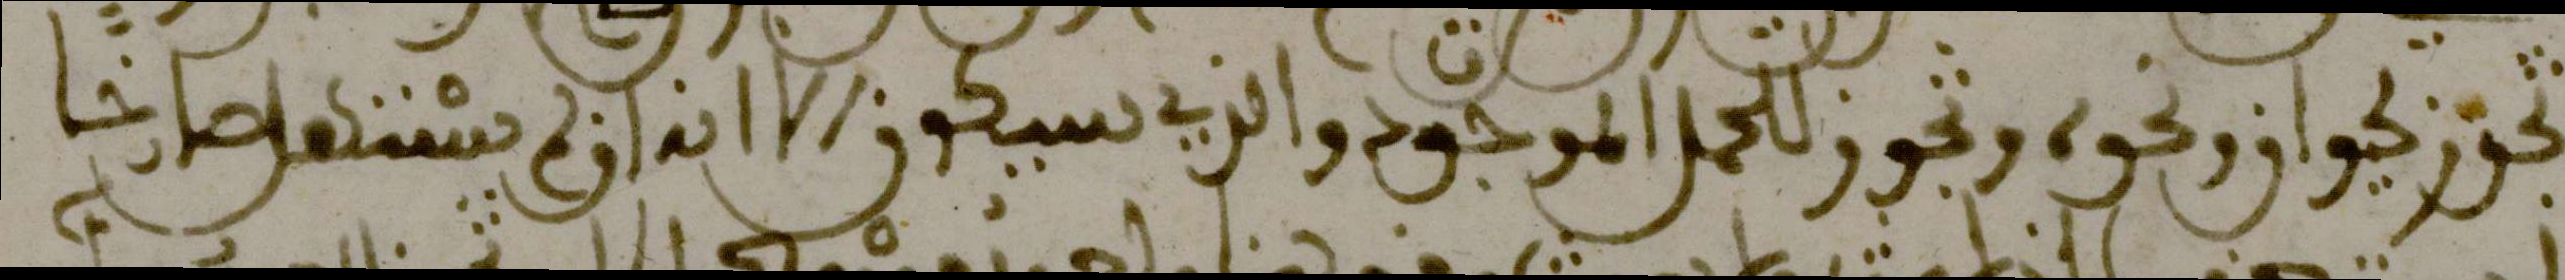تجوز لحيوان ونحوه وتجوز للحمل الموجود والذي سيكون الا انه لم يستهل صار خا
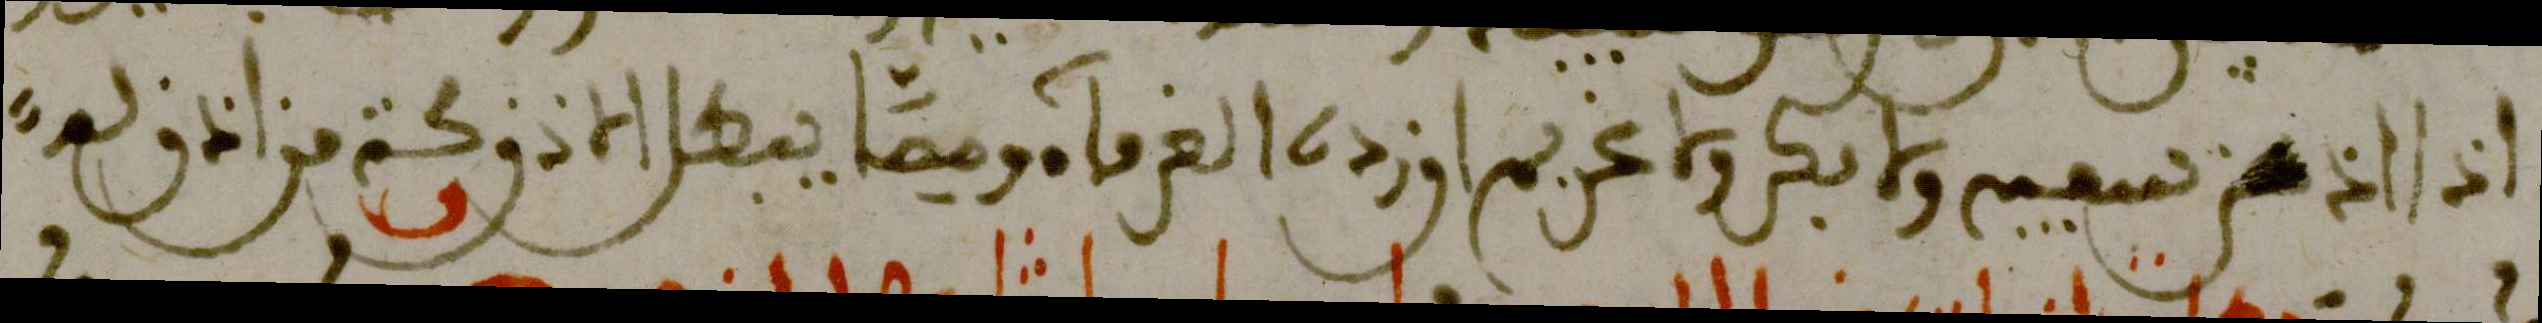اذا اذن سفيه ولا بكر ولا غريم ان رده الغرماء وممّا يبطل الاذن صحة من اذن له
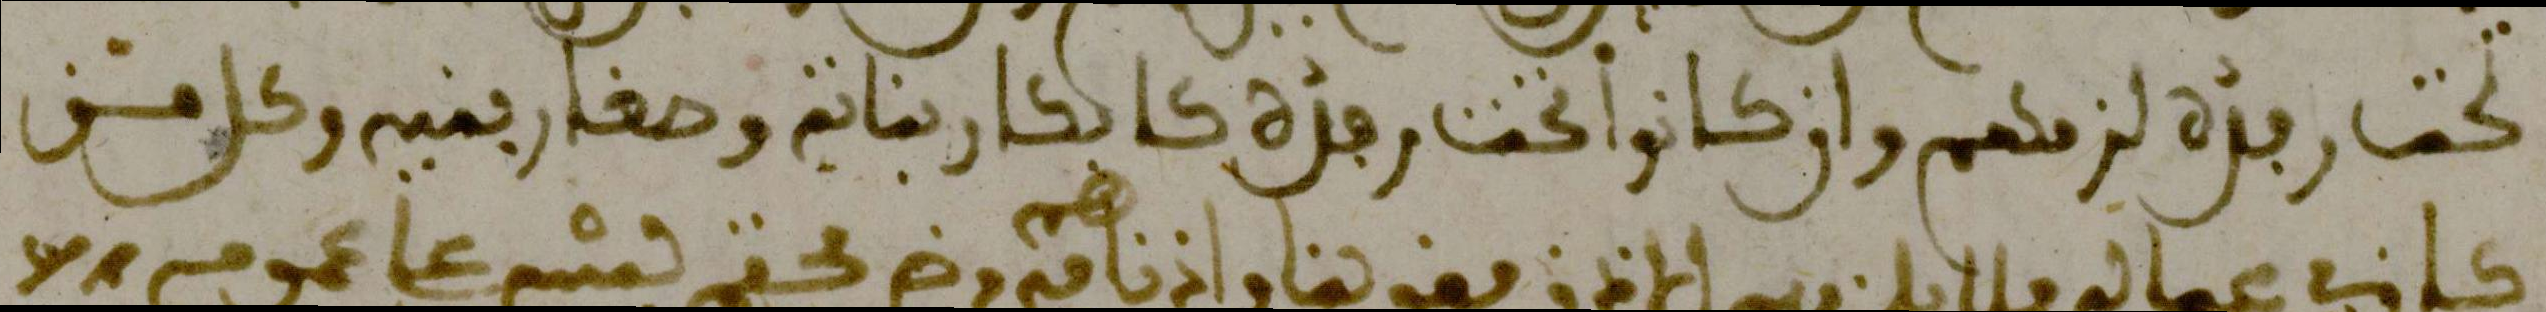تحت رفده لزمهم وان كانوا تحت رفده كابكار بناته وصغاز بنيه وكل من
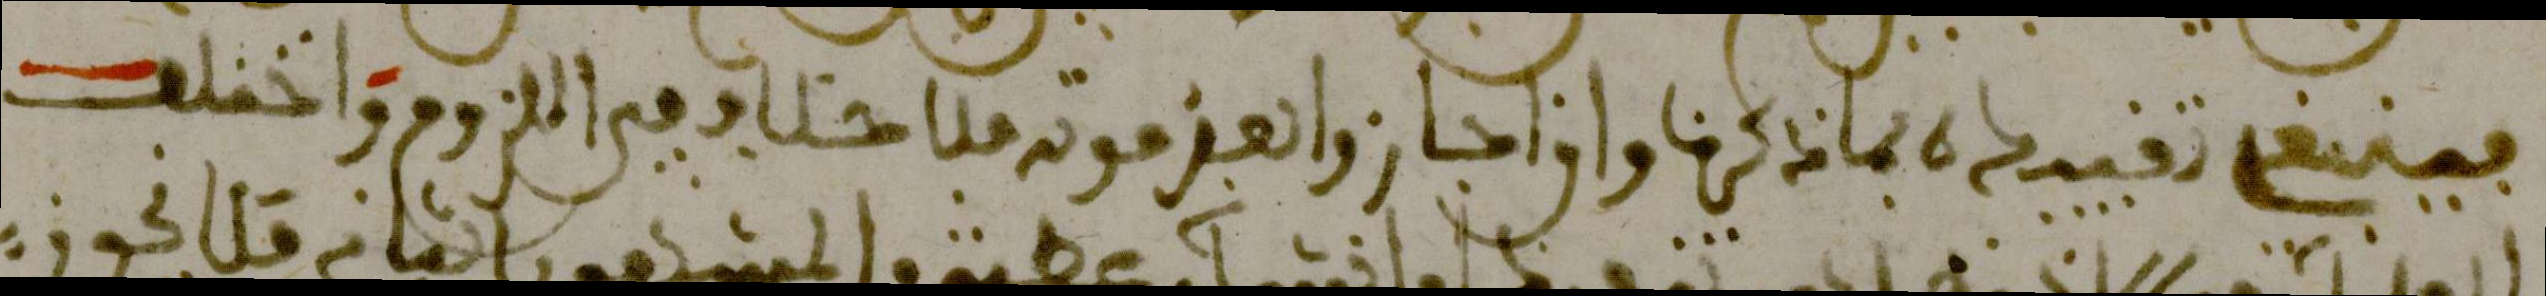فينبغي تقييده بما ذكرنا وان اجاز وابعد موته فلا خلاف في اللزوم واختلف
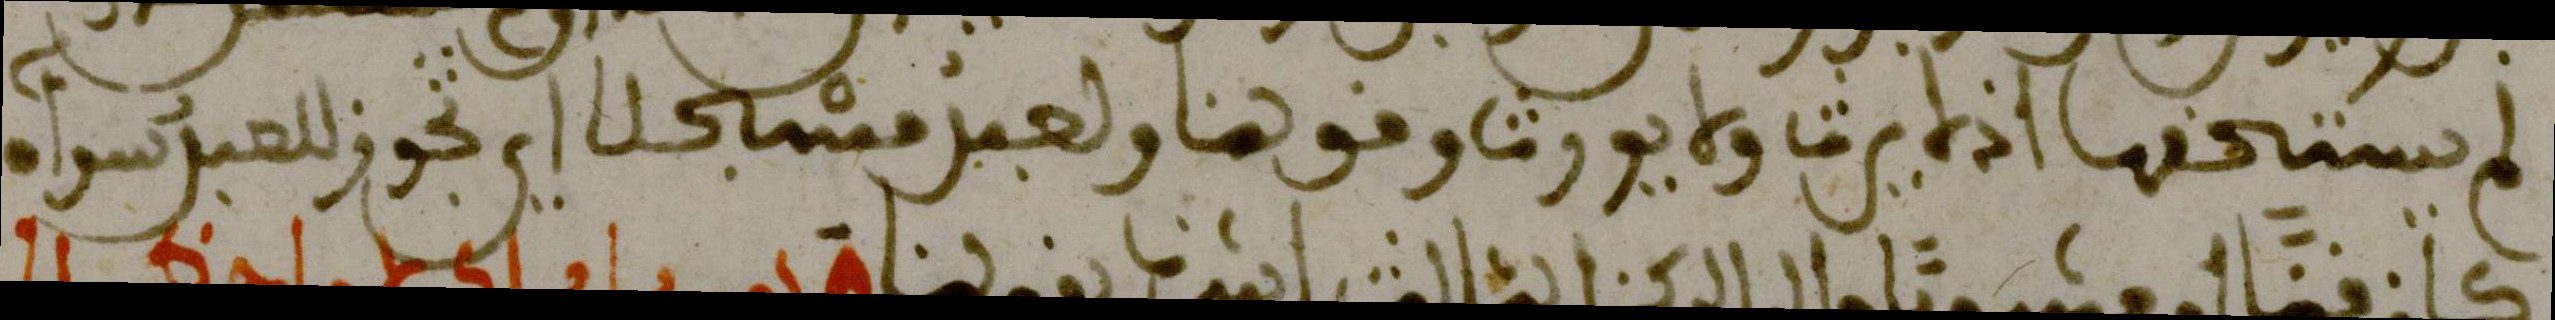لم يستحقها اذ لا يرث ولا يورث وقولنا ولعبد مسحجلا اي تجوز للعبد سواء
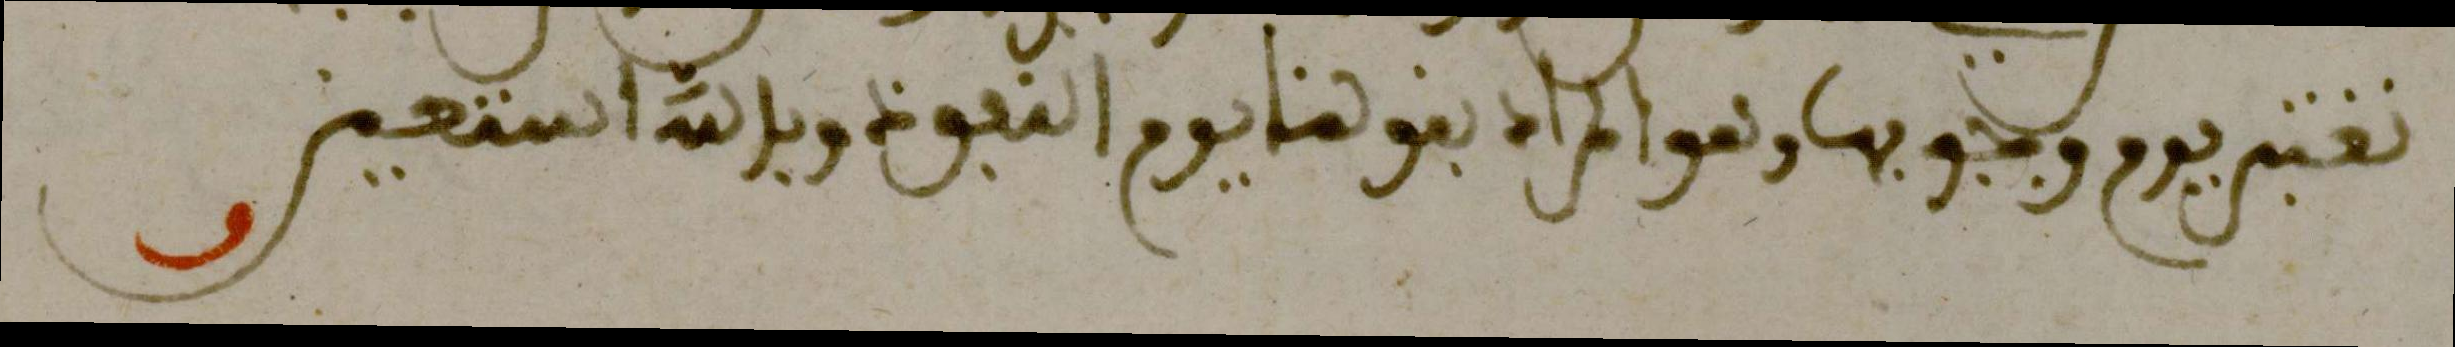تعتبر يوم وجوبها وهو المراد بقولنا يوم النفوذ ربالله استعين
